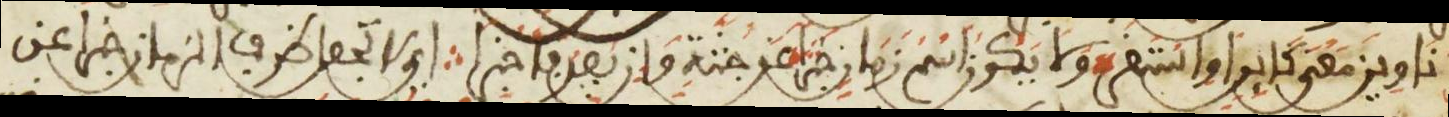ناوين معنى كابن او استقر و لا يكون اسم زمان خبرا عن جثة و ان يفد فاخبرا اي لا تجعل ظرف الزمان خبرا عن
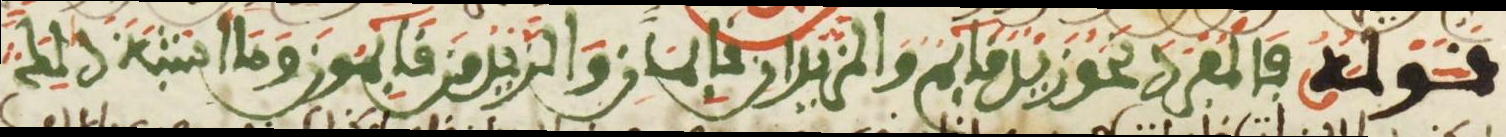قوله فالمفرد نحو زيد قائم و الزيدان قائمان والزيد ون قائمون و ما اشبه ذلك
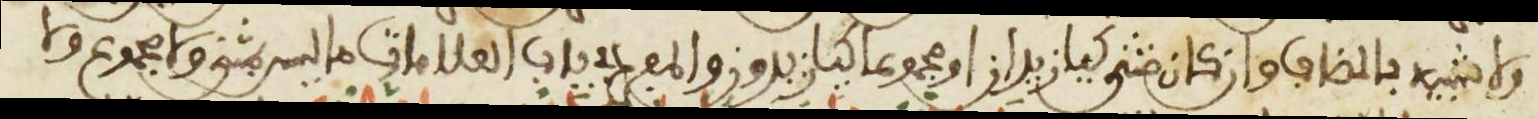ولا شبيه بالمضاف وان كان مثنى كيا زيدان او مجموعا كيا زيدون و المفرد في باب العلامات ما ليس بمثنى و لا مجموع و لا
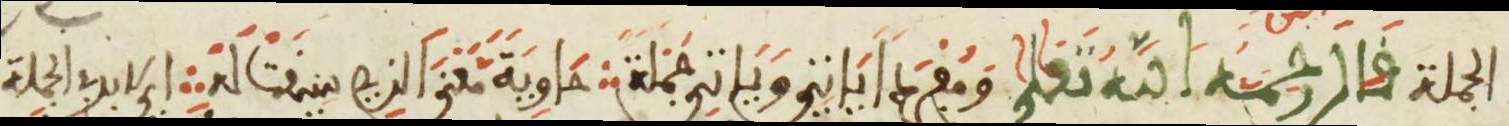الجملة قال رحمه الله تعلى ، مفردا يأتي و يأتي جملة حاوية معنى الذي سيقت له أي لا بد في الجملة
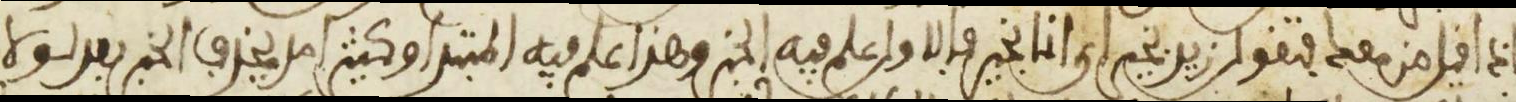اذا قيل من معك فتقول زيد بخير اى انا بخير فالاول علم فيه الخبر وهذا علم فيه المبتدا و كثيرا من يحذف الخبر بعد لولا
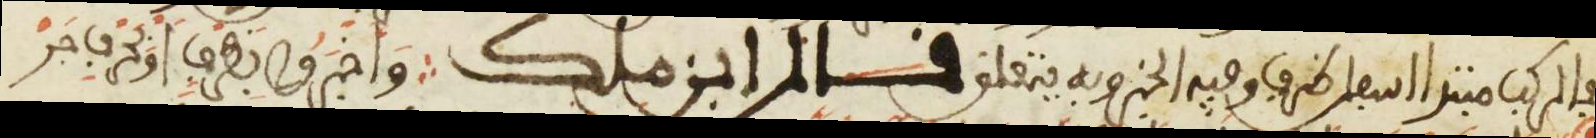فالركب مبتدا اسفل ظرف و فيه الخبر و به يتعلق قال ابن ملك و أخبروا بظرف او بحرف جر
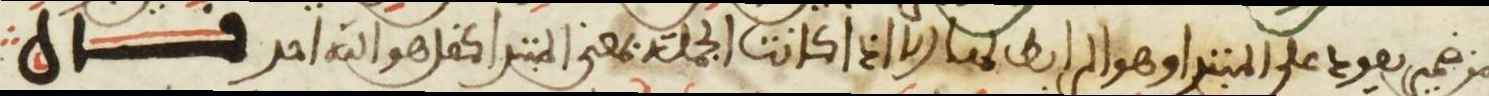من ضمير يعود على المبتد او هو الرابط لها الا اذا كانت الجملة بمعنى المبتدا كقل هو الله احد قال
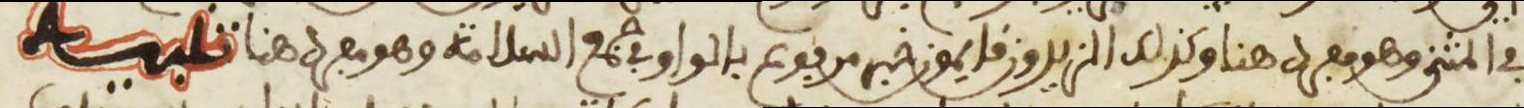في المثنى و هو مفرد هنا و كذلك الزيدون قائمون خبر مرفوع بالواو فى جمع السلامة و هو مفرد هنا تنبيه
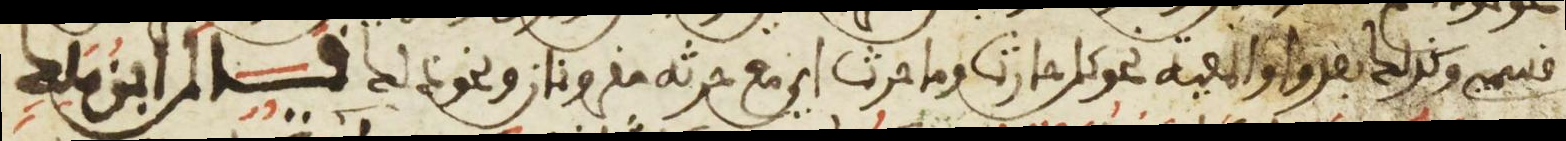فسمي و كذلك بعد واو المعية نحو كل حارث و ما حرث اي مع حرثه مقرونان و نحو ذلك قال ابن ملك
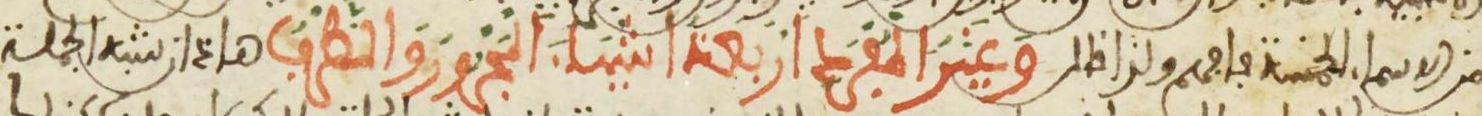من الاسماء الخمسة فافهم و لذا ظل و غير المفرد اربعة اشياء المجرور و الظرف هاذان شبه الجملة
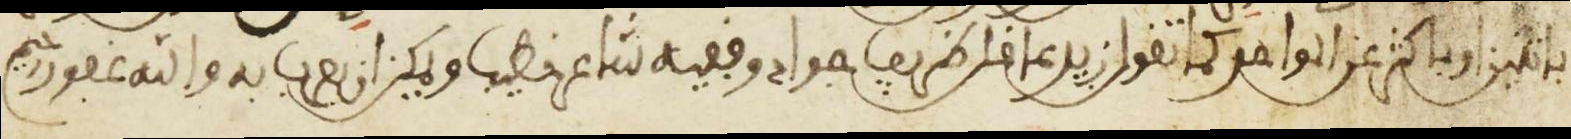باثنين او باكثر عن الواحد كما تقول زيد عاقل ظريف جواد و فقيه شاعر خطيب و يمكن ان يعرب به و الله غفور رحيم
